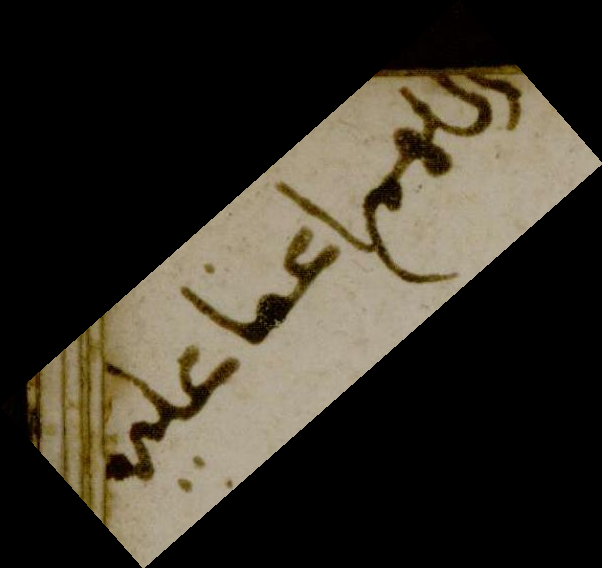الهم اعما عليه
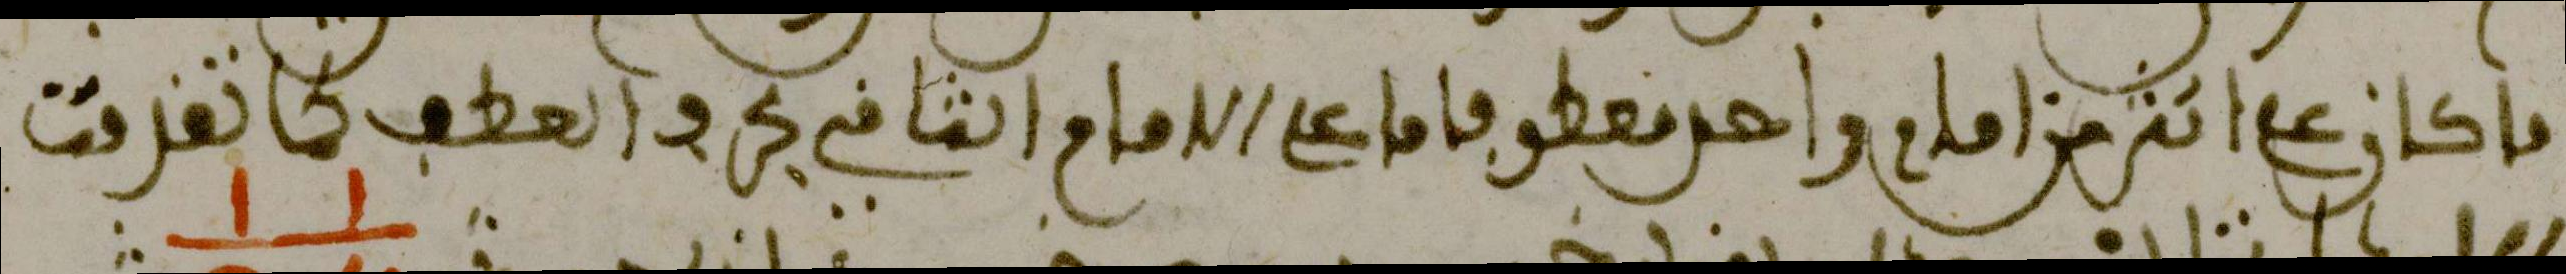ما كان على اكثر من امام واحد معطوفا ما على الامام الثاني بحرف العطف كما تقدمت
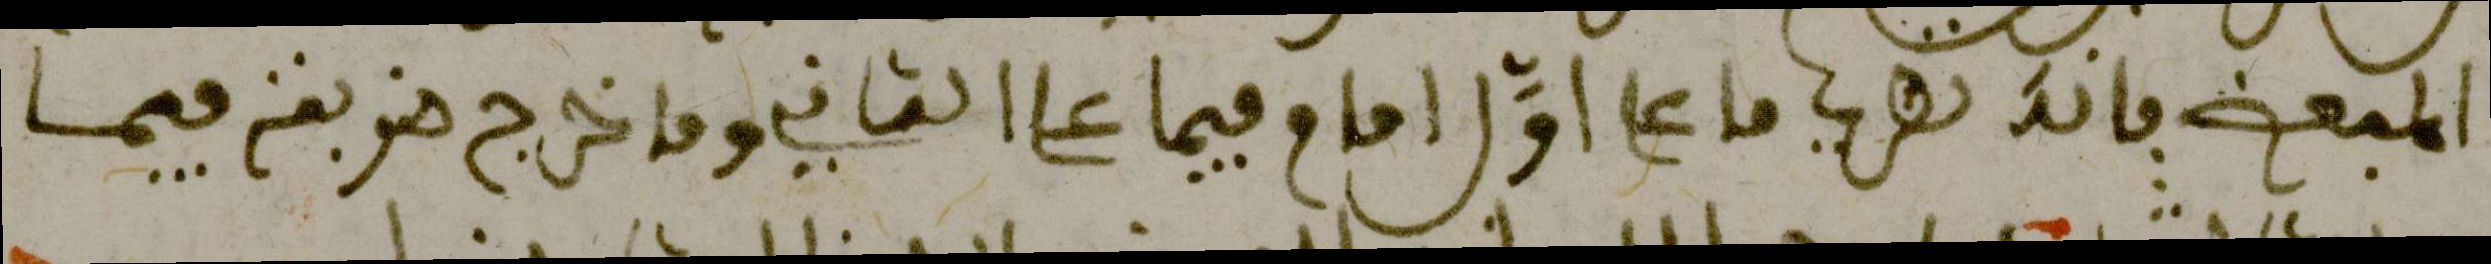المبعض فانك تضرب ما على اوّل امام فيما على الثاني و ما خرج ضربته فيما
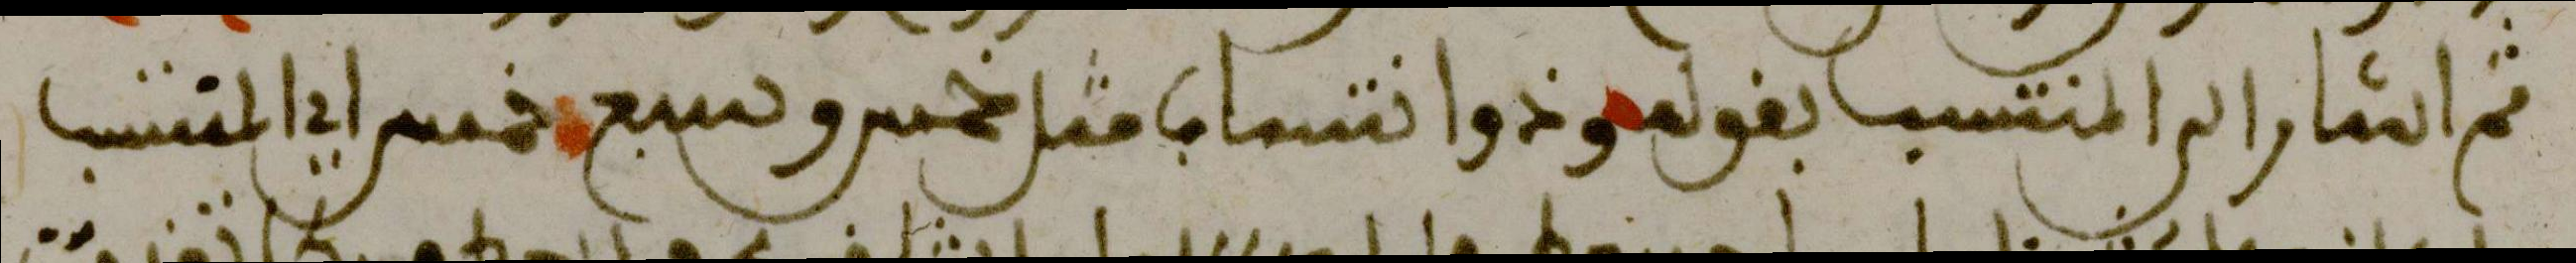ثم اشار الى المنتسب بقوله و ذو انتساب مثل خمس و سبع خمس اي المنتسب
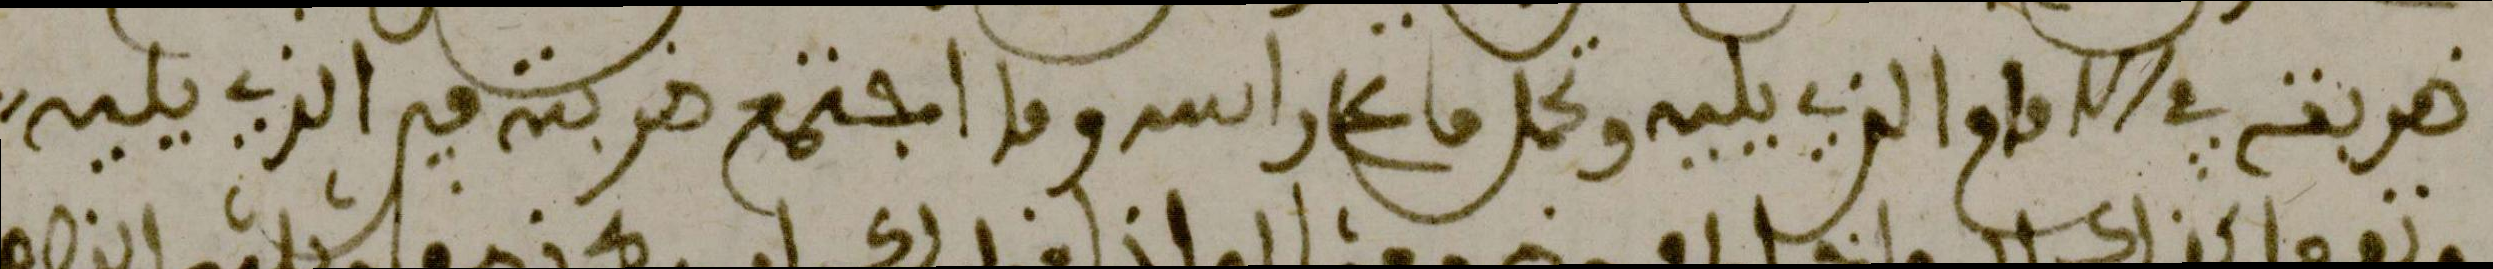ضربته في الامام الذي يليه و تحمل ما على راسه و ما اجتمع ضربته في الذي يليه
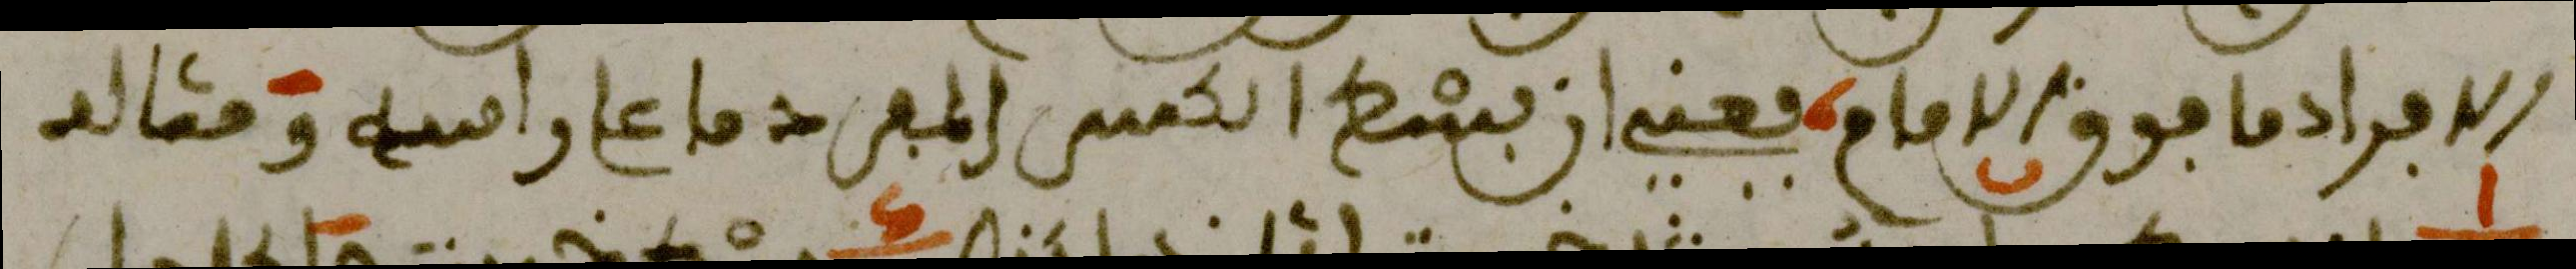الافراد ما فوق الامام يعني ان بسط الكسر المفرد ما على راسه و مثاله
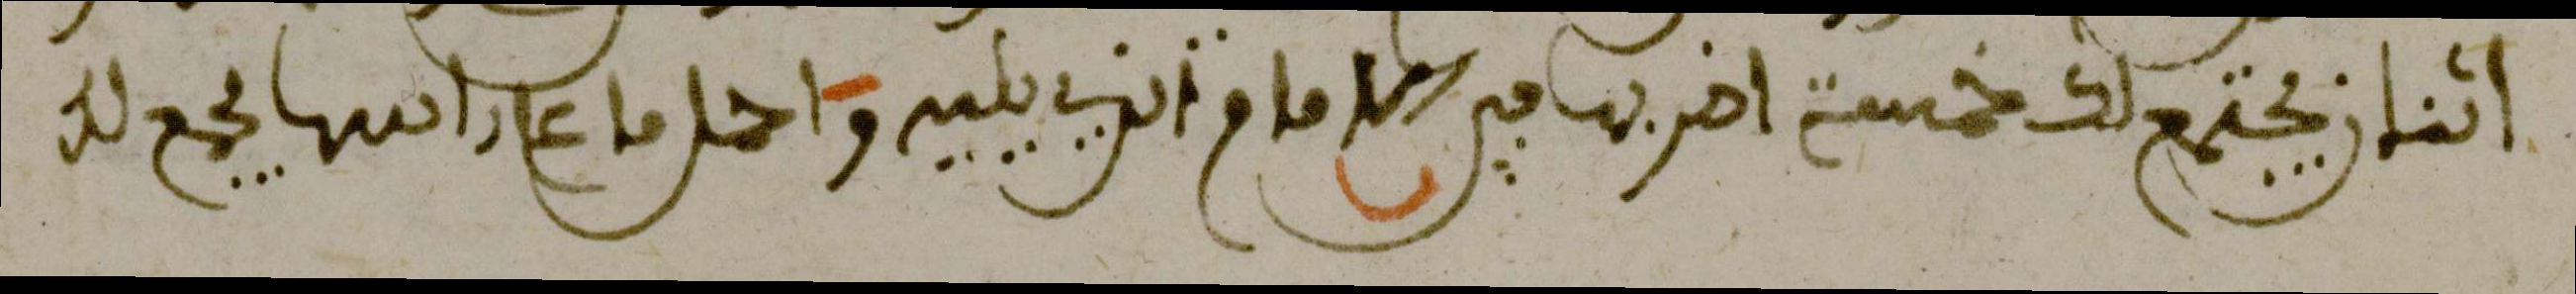اثنان يجتمع لك خمسة اضربها في الامام و الذي يليه واحد ما على راسها يجمع لك
